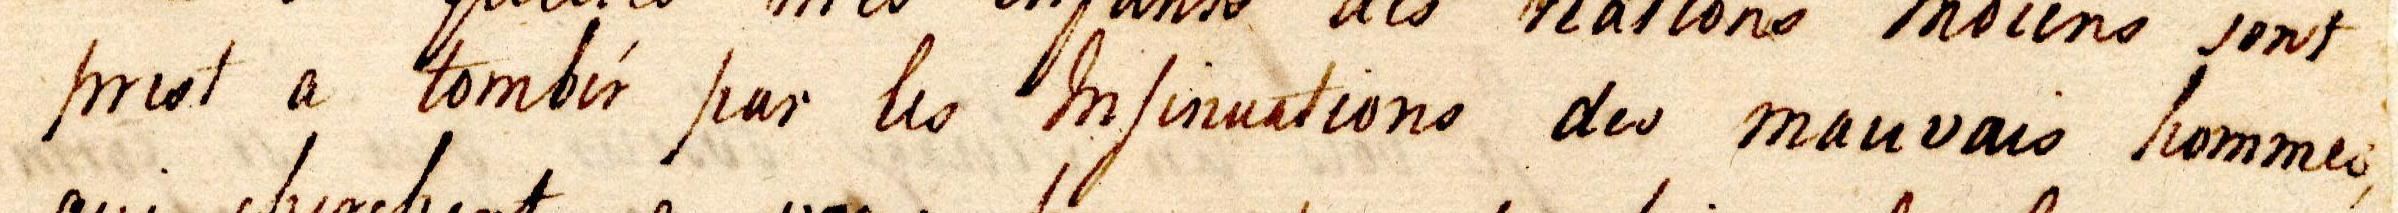prest a tombér par les Insinuations des mauvais hommes,
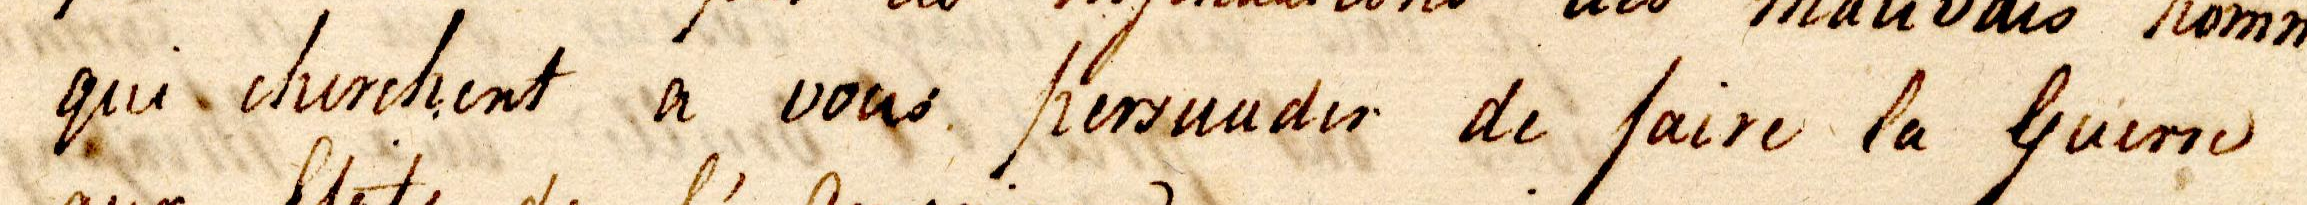qui cherchent a vous persuader de faire la Guerre
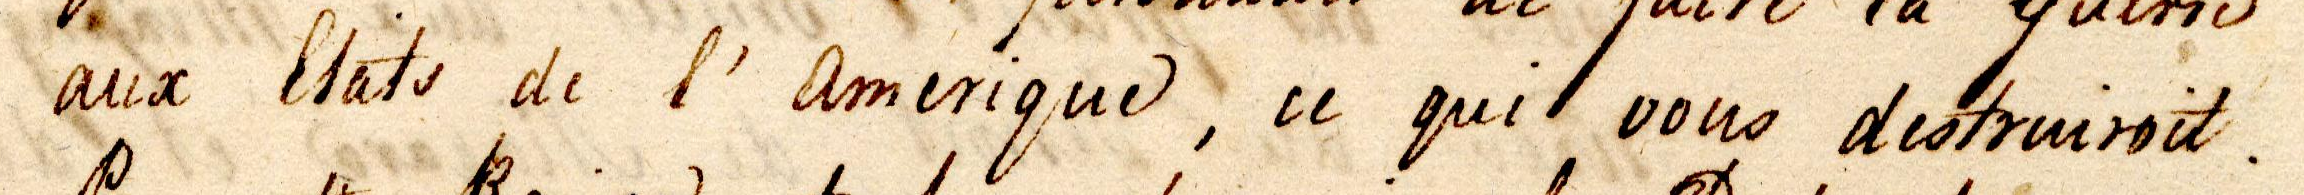aux Etats de l'Amerique, ce qui vous destruiroit.
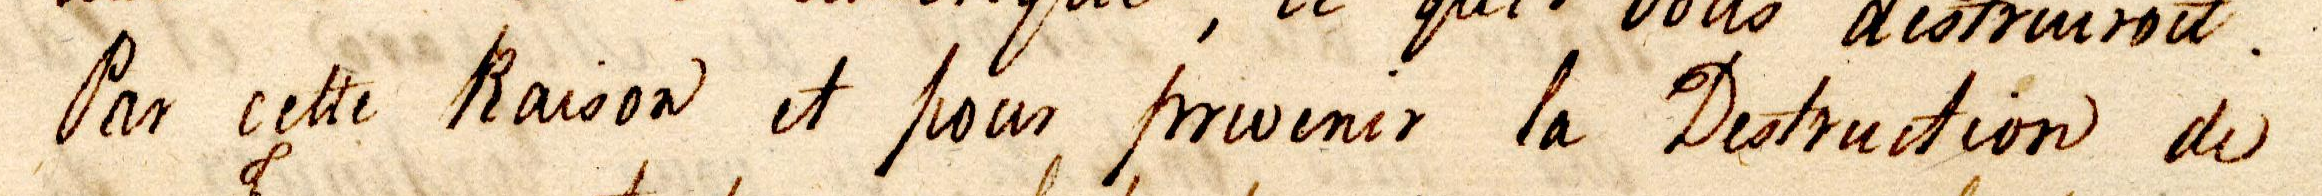Par cette Raison et pour prevenir la Destruction de
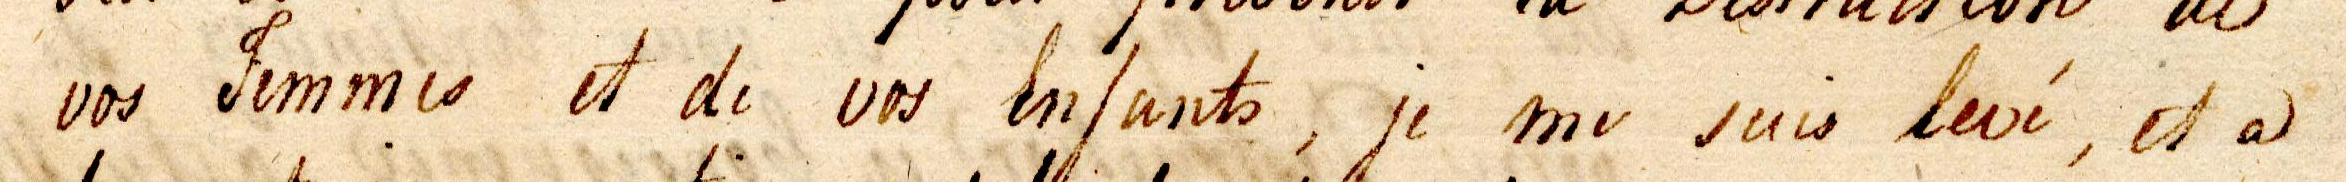vos Femmes et de vos Enfants, je me suis levé, et a
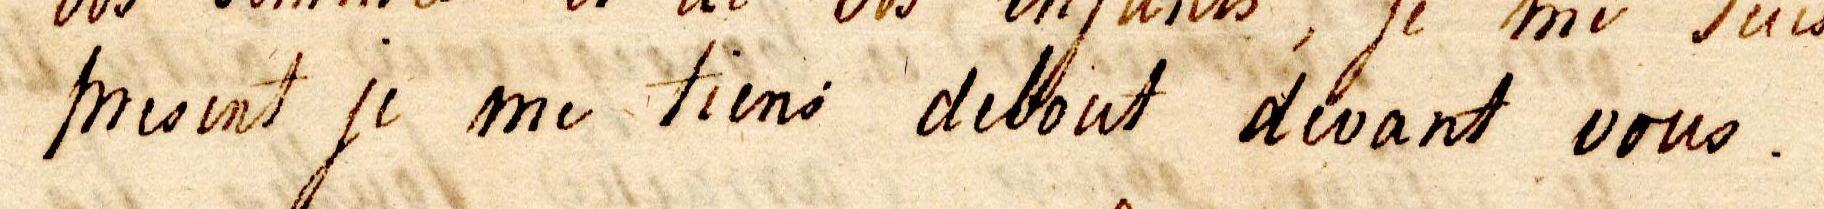present je me tiens debout devant vous
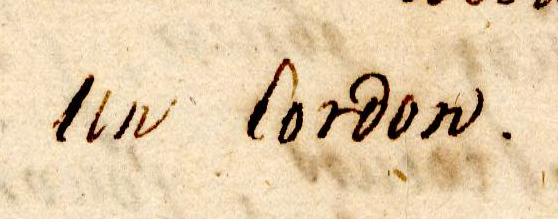Un Cordon.
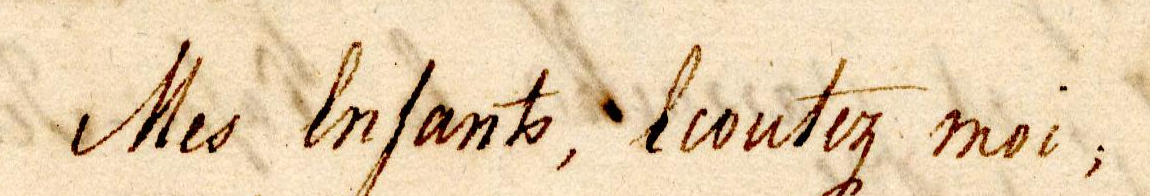Mes Enfants, Ecoutez moi;
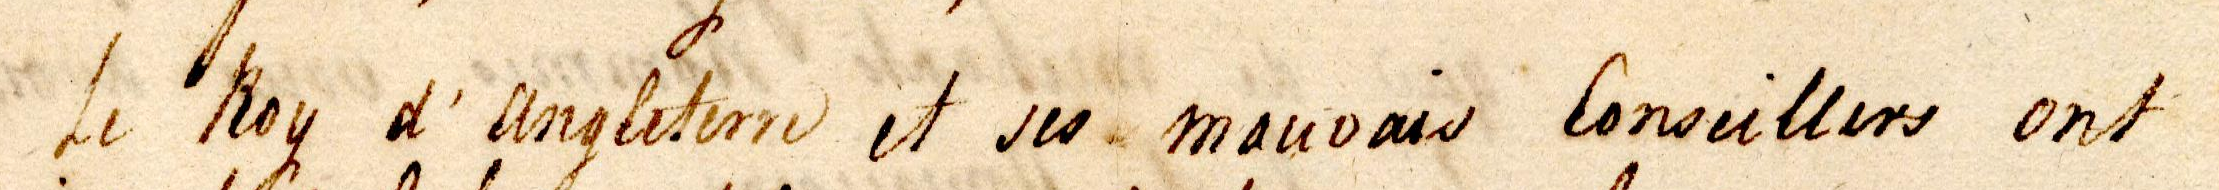Le Roy d'Angleterre et ses mauvais Conseillers ont
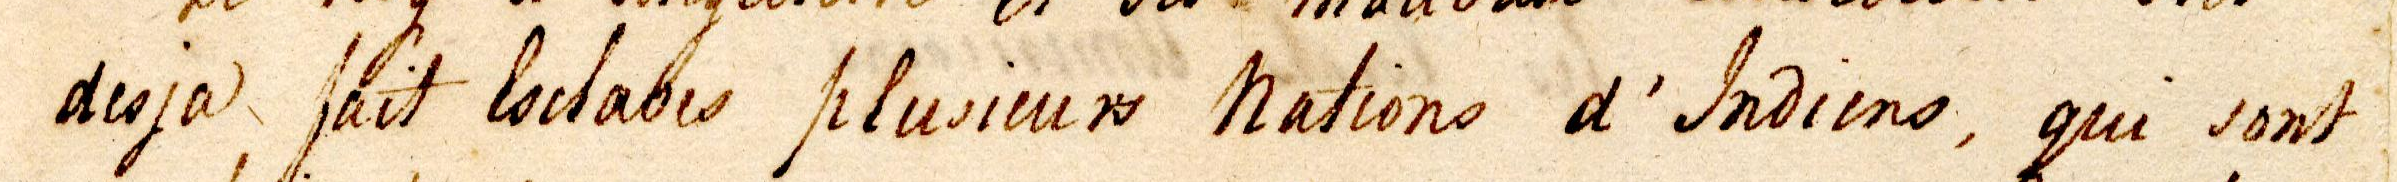desja fait Esclaves plusieurs Nations d'Indiens, qui sont
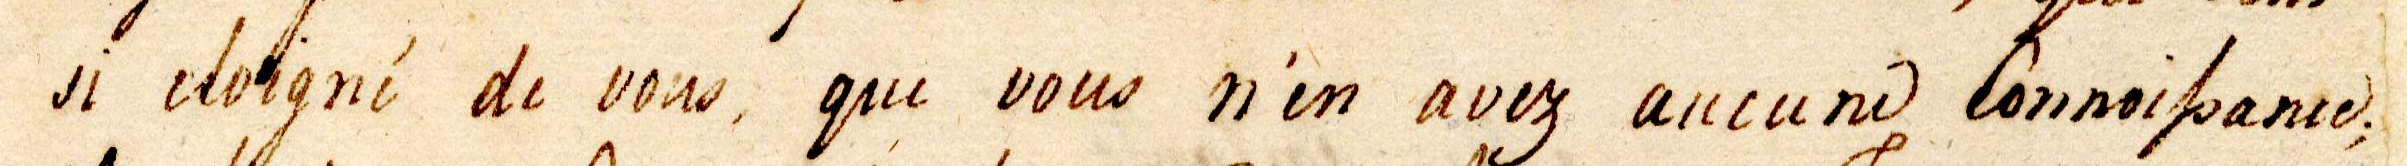si cloigné de vous que vous n'en avez aucune Connoissance.
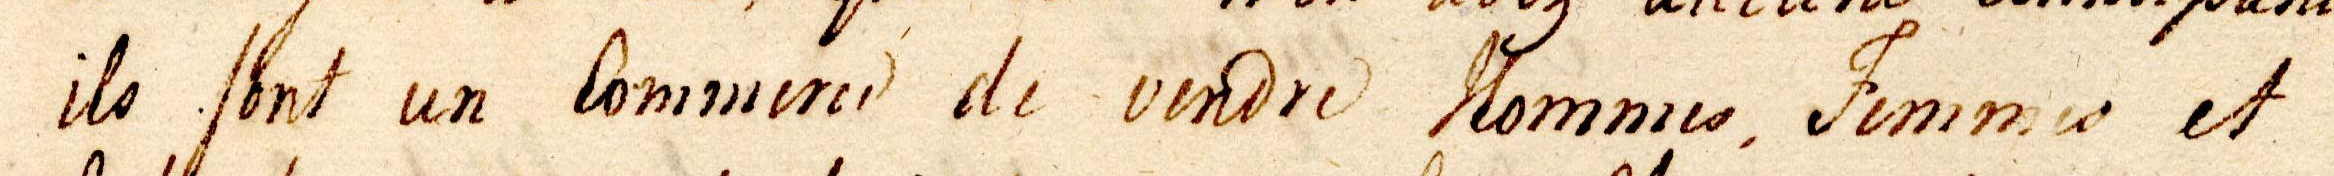ils sont un Commerce de vendre Hommes, Femmes et
